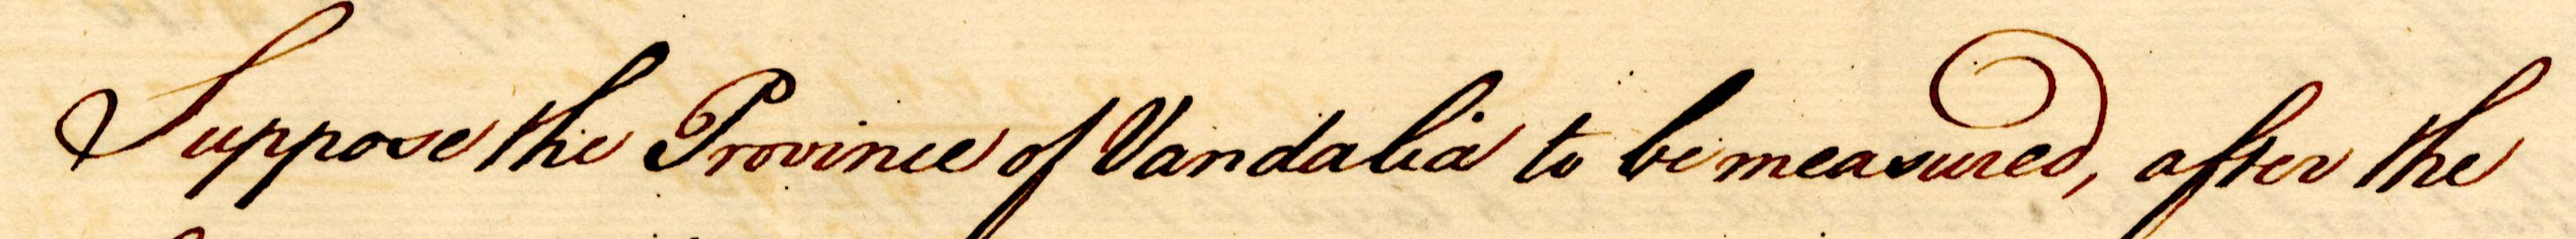Suppose the Province of Vandalia to be measured, after the
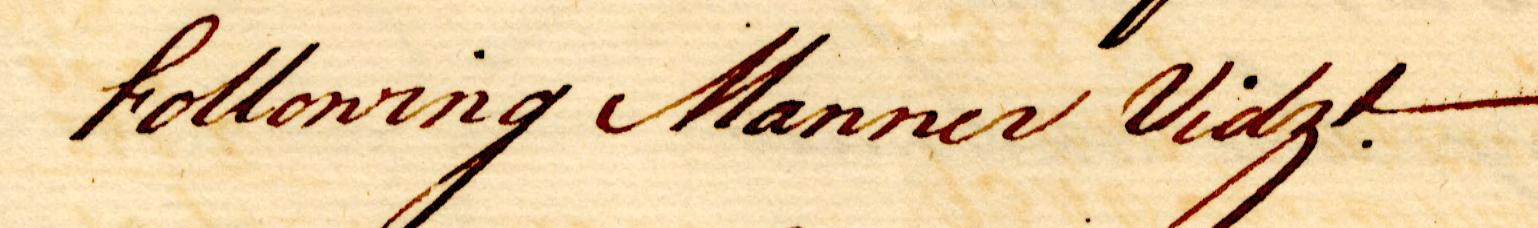following Manner Vidzt.
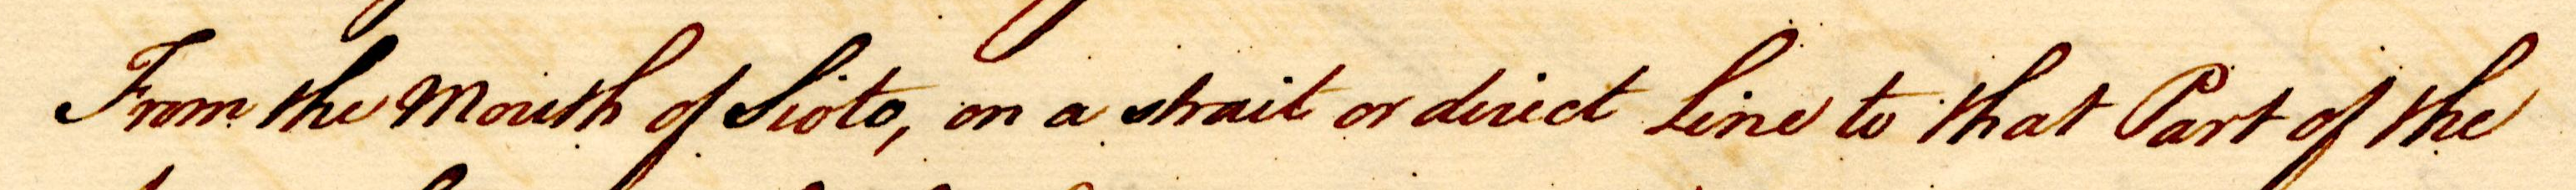From the Mouth of Sioto, on a strait or direct Line to that Part of the
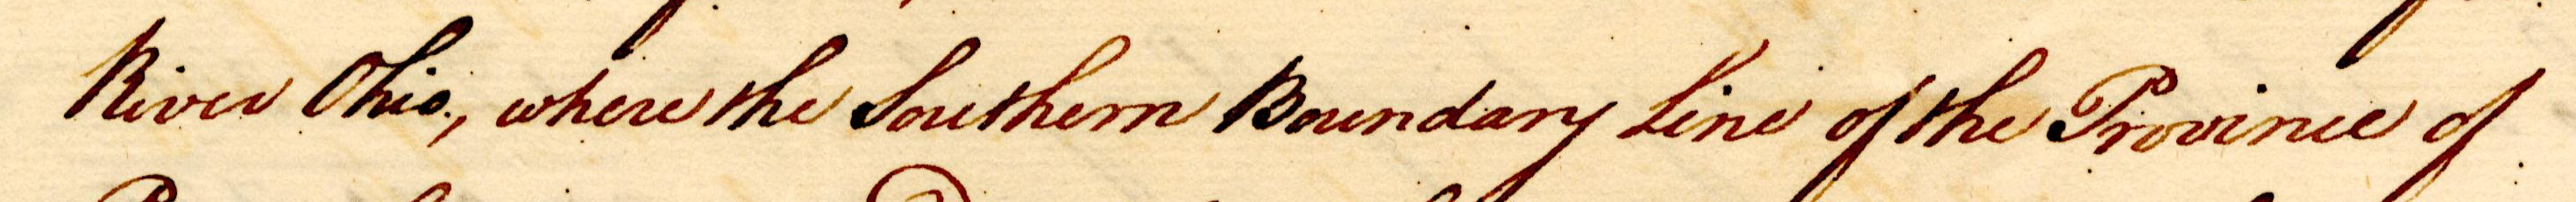River Ohio, where the Southern Boundary Line of the Province of
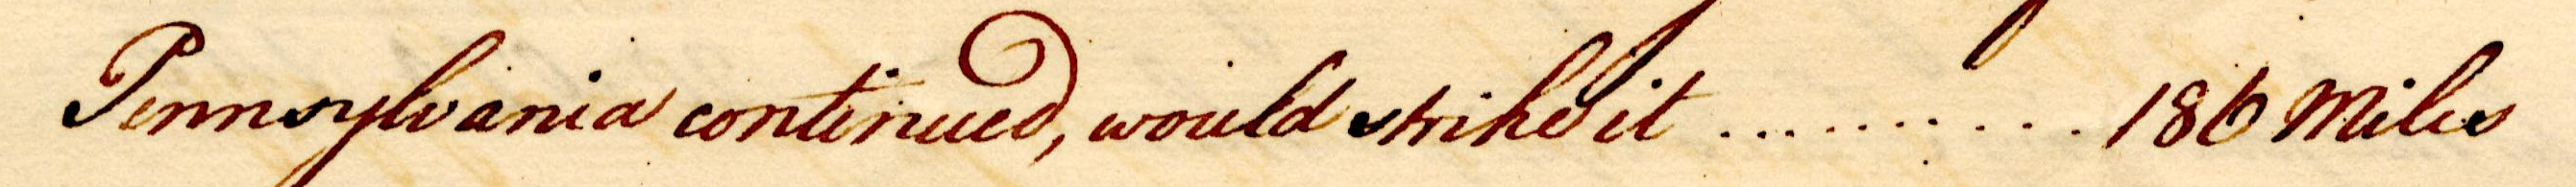Pennsylvania continued, would strike it.......... 186 Miles
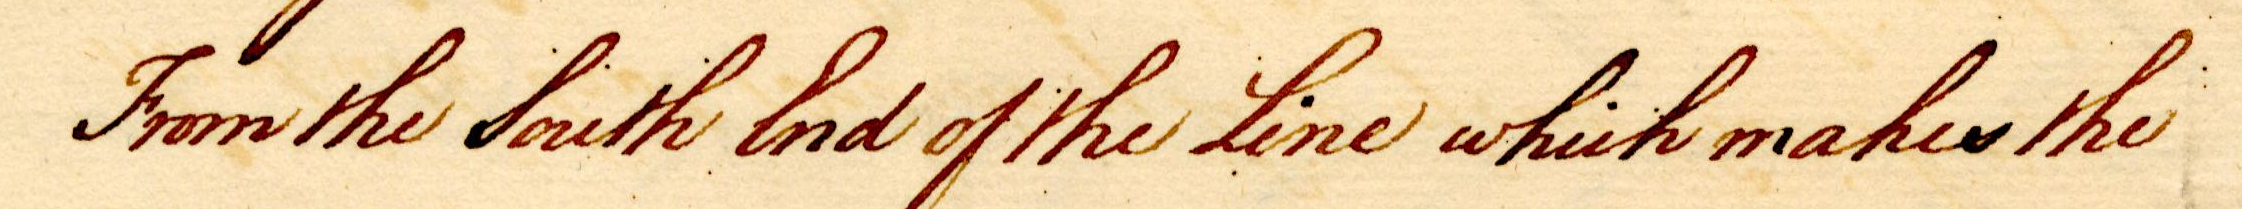From the South End of the Line which makes the
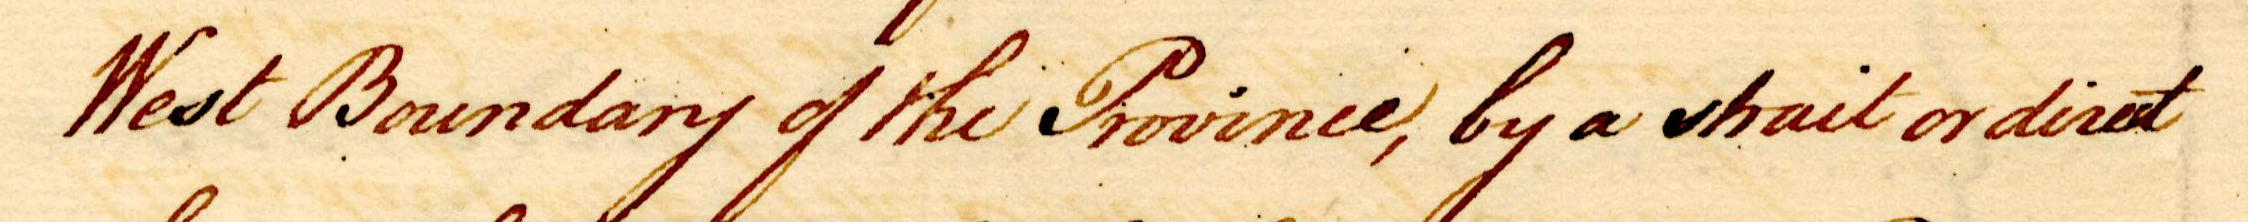West Boundary of the Province, by a strait or direct
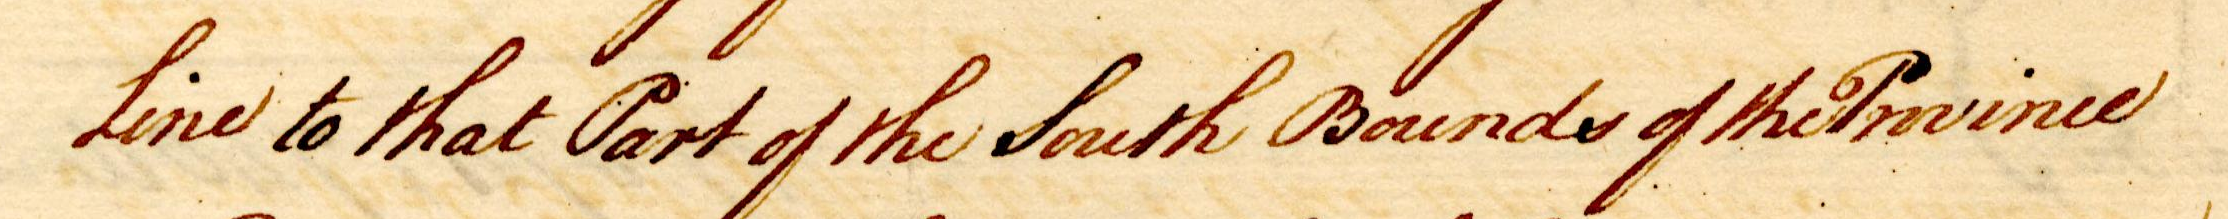Line to that Part of the South Bounds of the Province
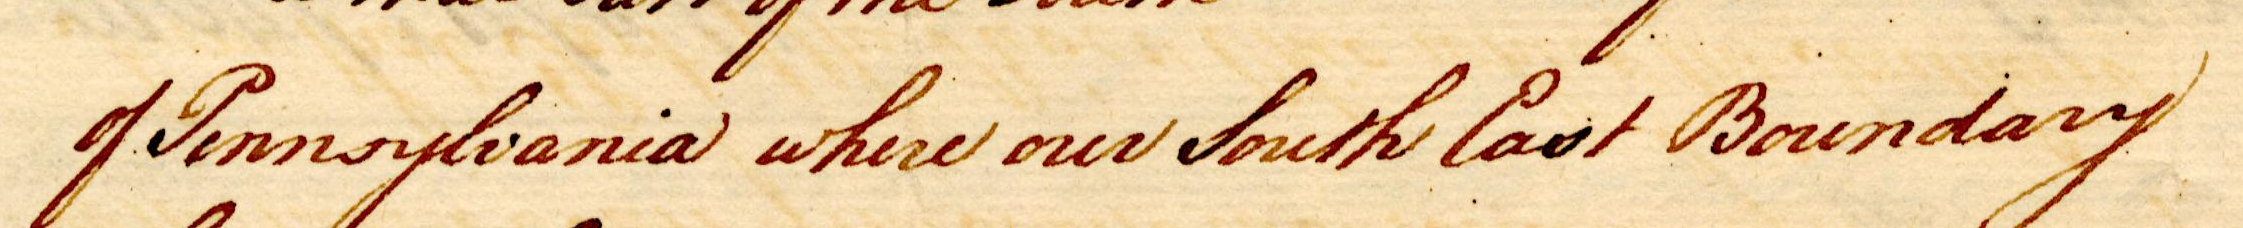of Pennsylvania where our South East Boundary
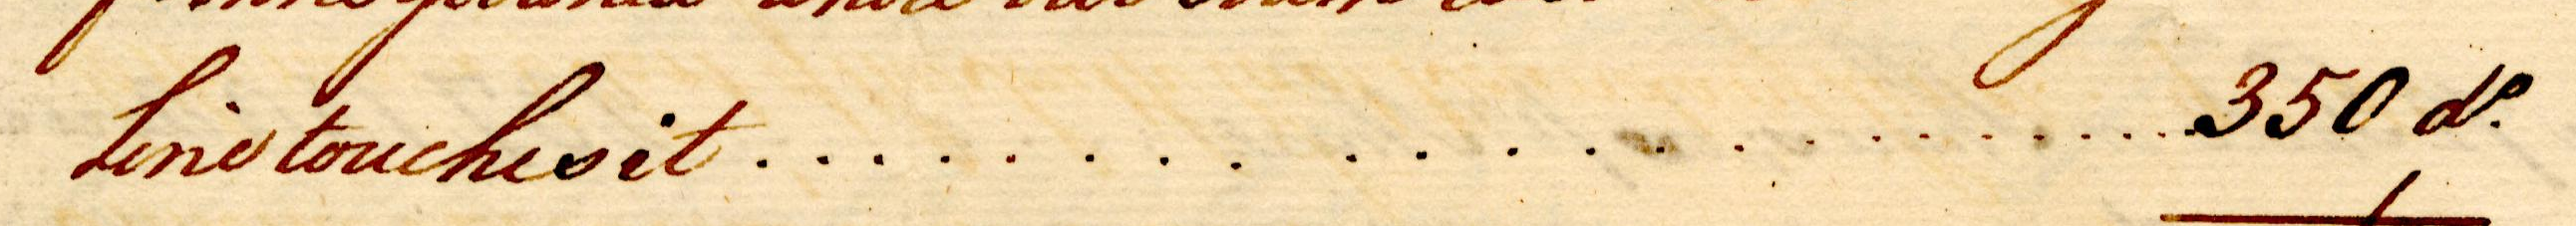Line touches it.................. 350 d^o.
